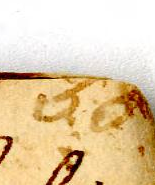50
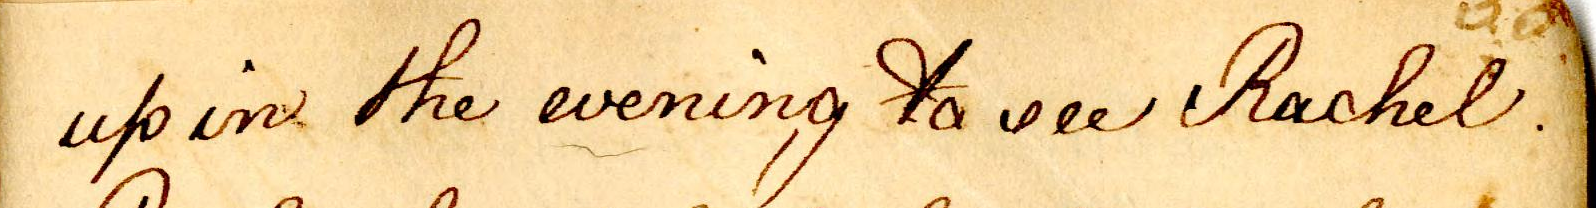up in the evening to see Rachel.
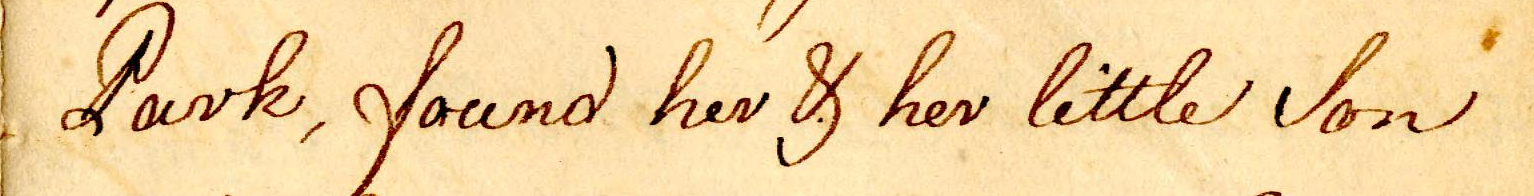Park, found her & her little Son
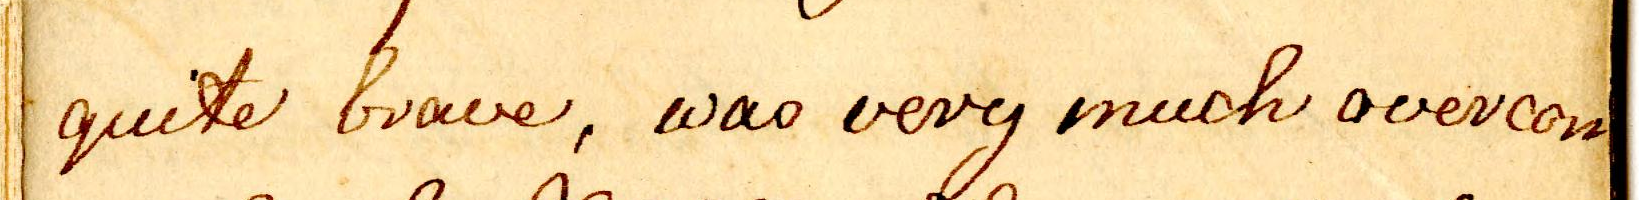quite brave, was very much overcom
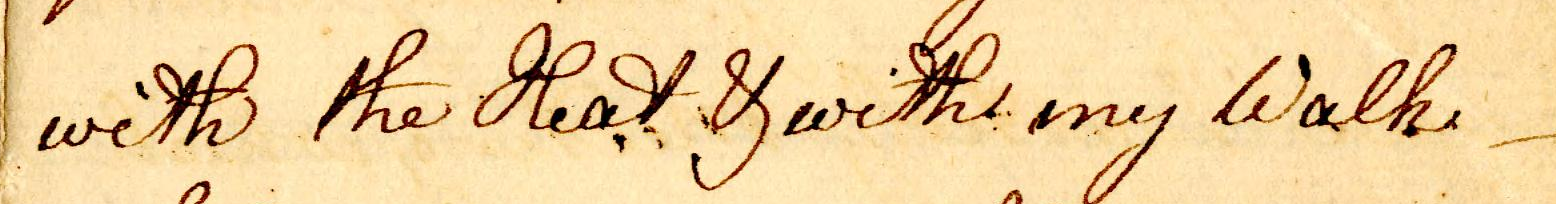with the Heat & with my Walk
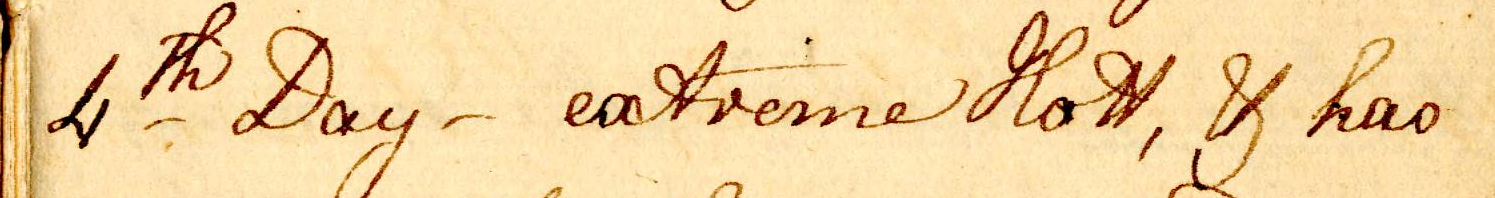4^th Day- extreme Hott, & has
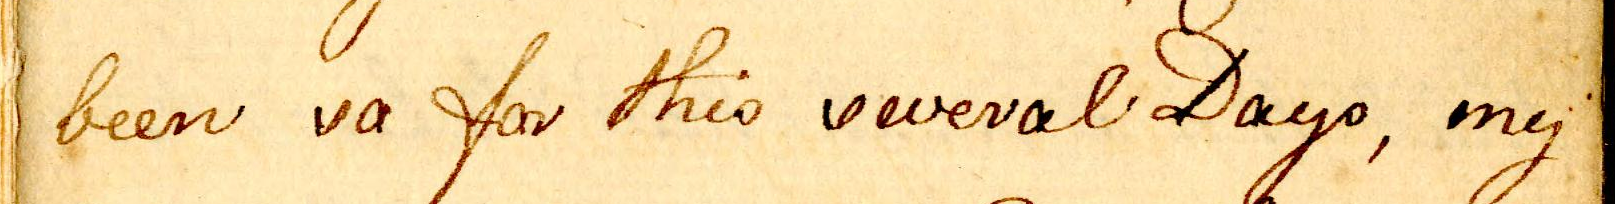been so for this several Days, my
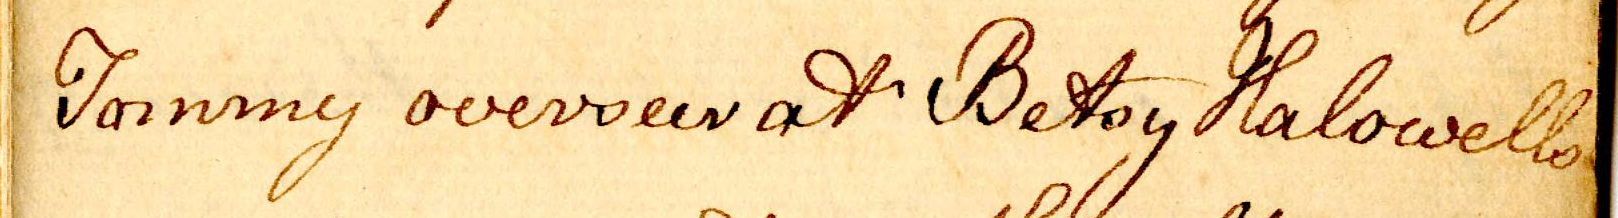Tommy overseer at Betsy Halowells
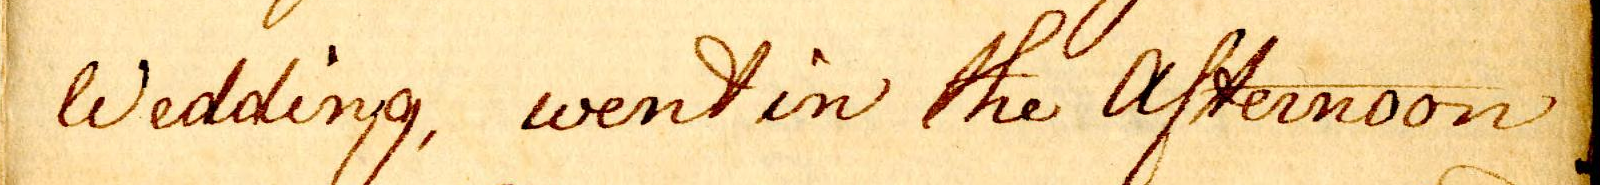Wedding, went in the Afternoon
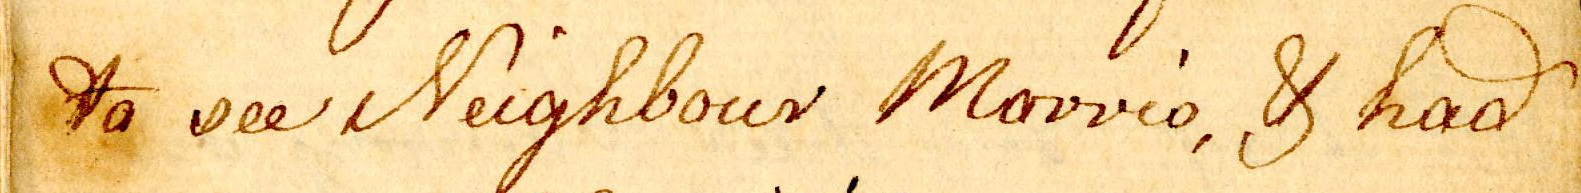to see Neighbour Morris, & had
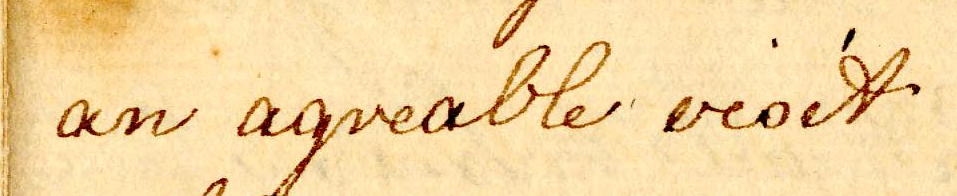an agreable visit
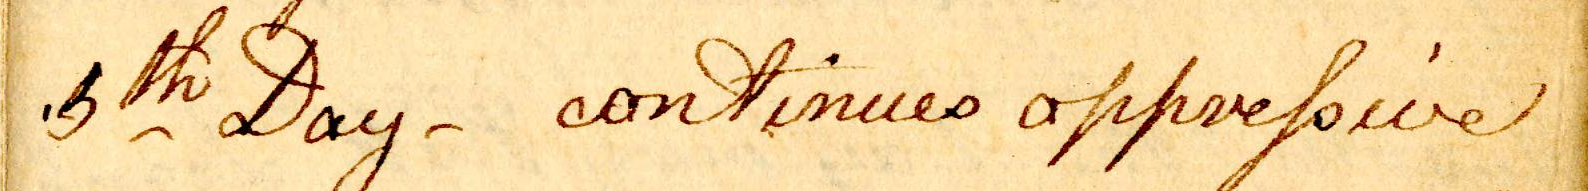5^th Day- continues oppressive
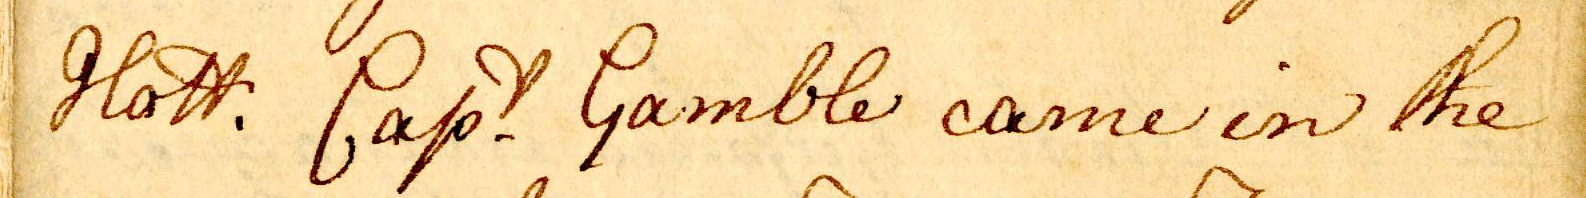Hott. Cap^t. Gamble came in the
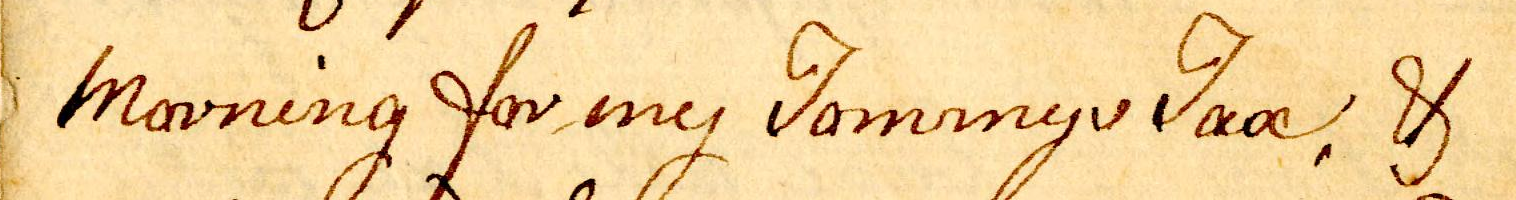Morning for my Tommys Tax &
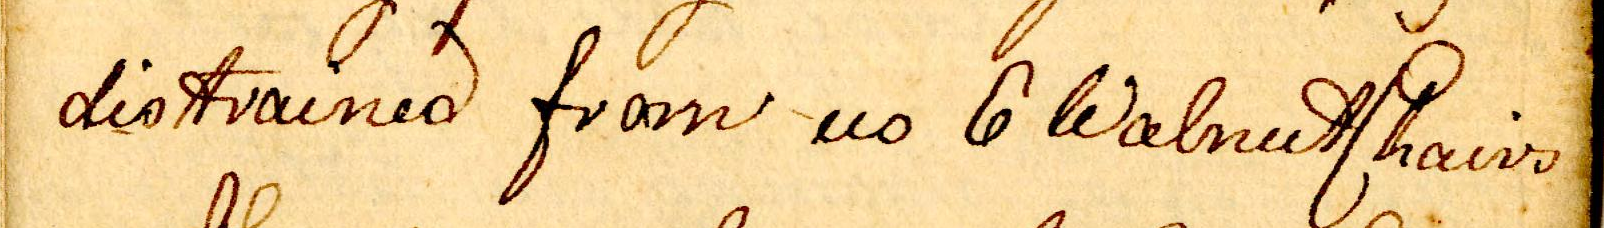distrained from us 6 Walnut Chairs
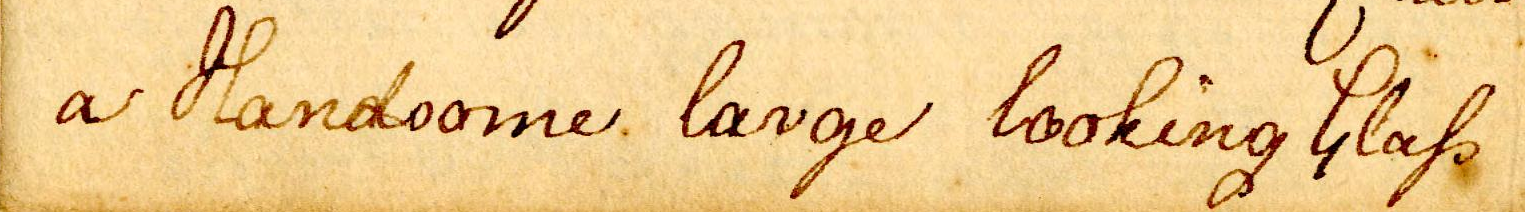a Handsome large looking Glass
